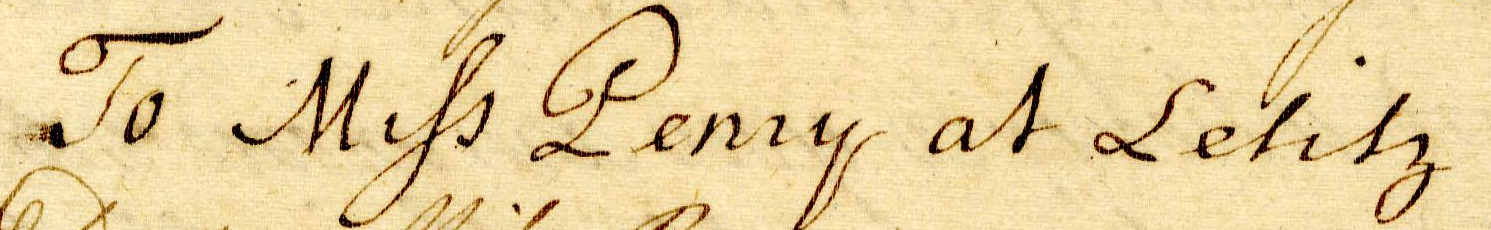To Miss Penny at Letitz
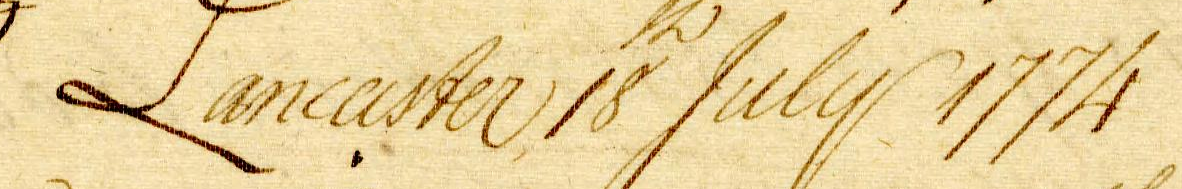Lancaster 18^th July 1774
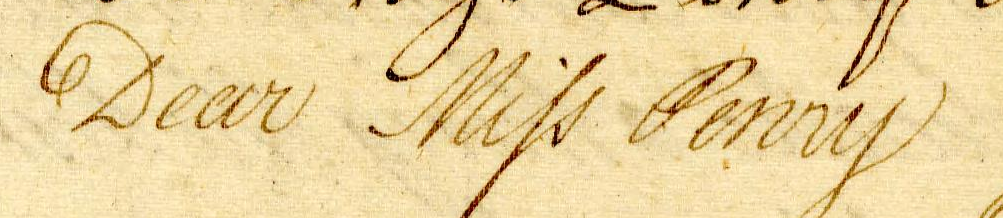Dear Miss Penny
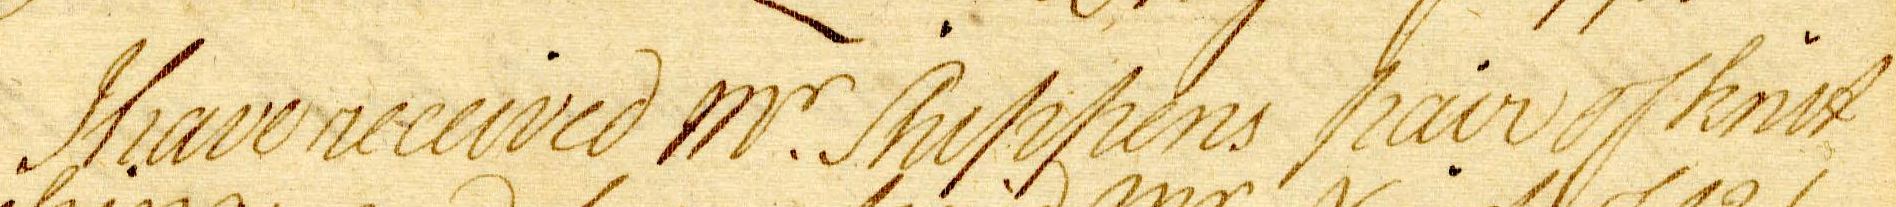I have received M^r. Shippens pair of knit
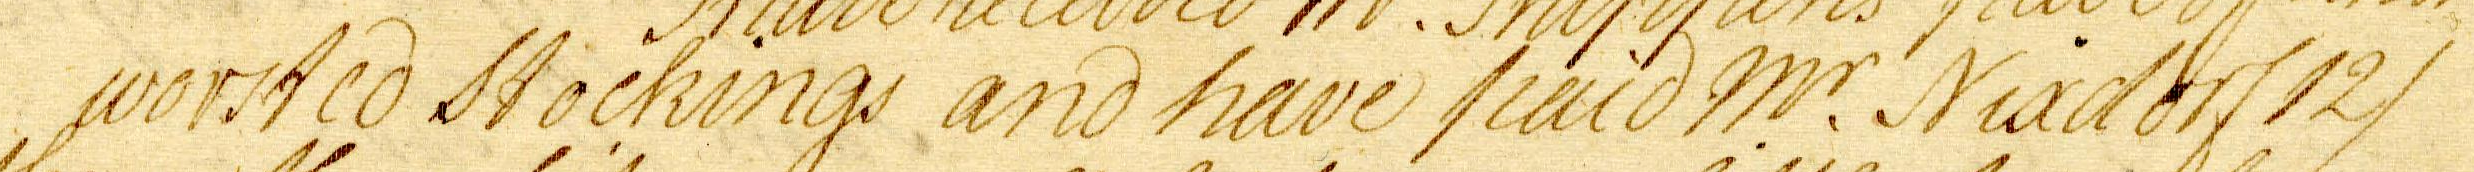worsted Stockings and have paid M^r. Nixdorf 12s
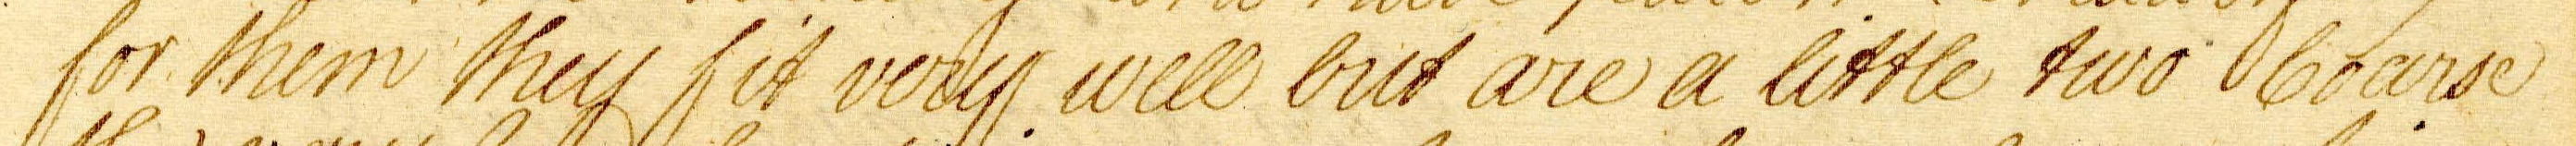for them they fit very well but are a little two Coarse
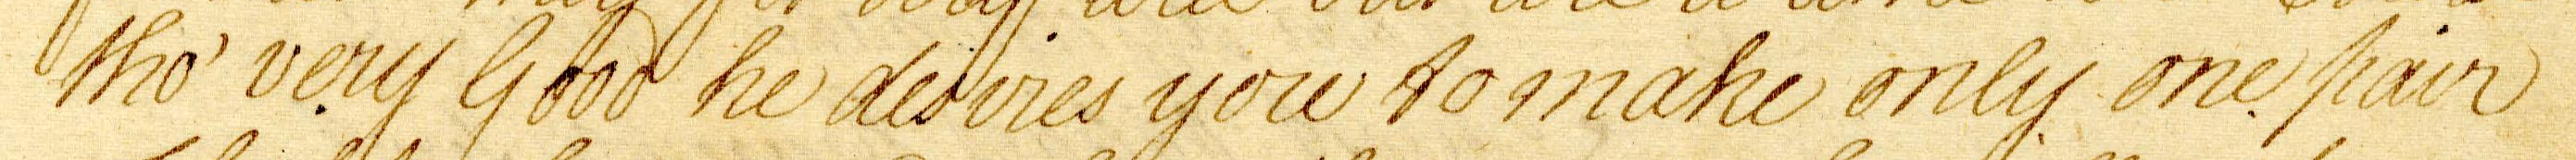tho' very Good he desires you to make only one pair
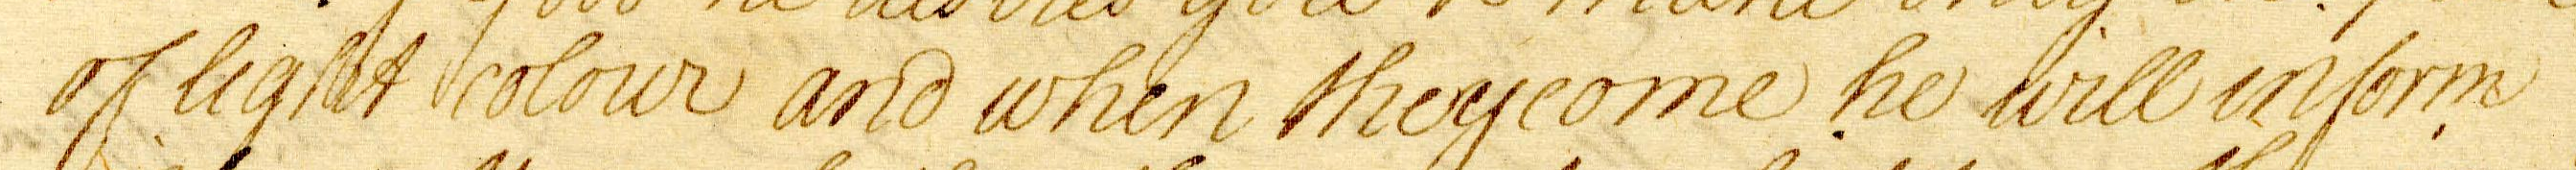of light colour and when they come he will inform
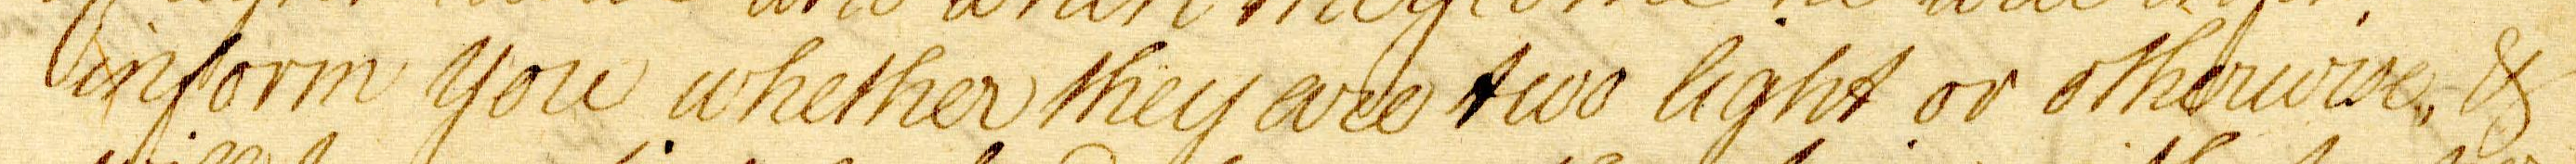inform You whether they are two light or otherwise, &
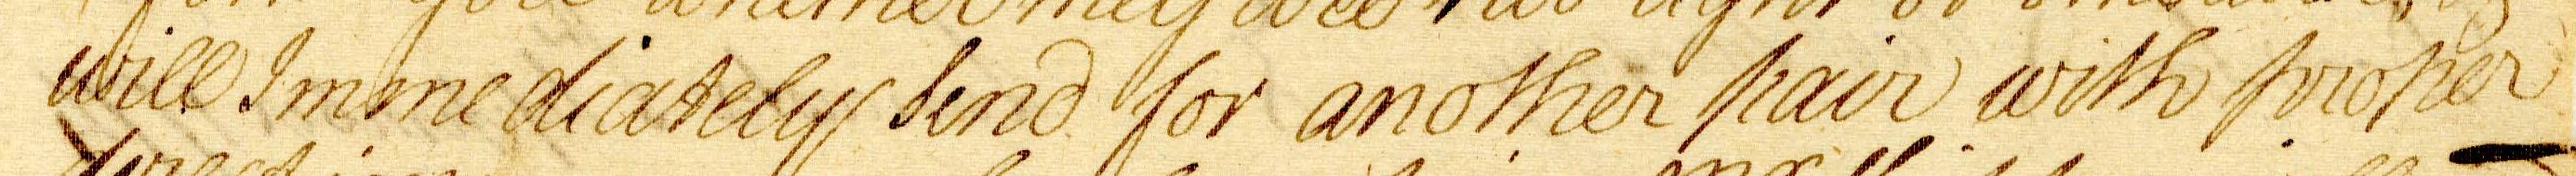will Immediately send for another pair with proper
